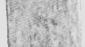六
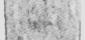十
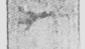九
